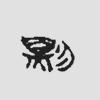則
